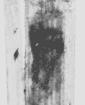夫
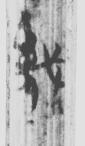幾
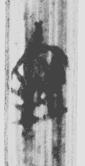{宀臸}
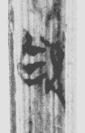色
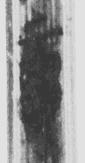{畐貝}
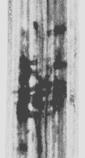貴
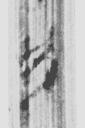乃
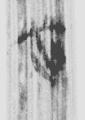必
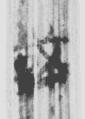或
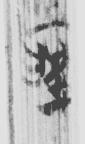聖
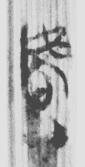{虍几口}
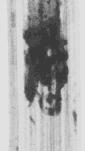唯
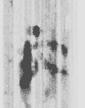亓
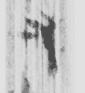又
